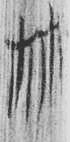○（靡）
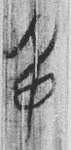身
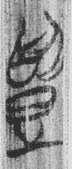豊（體）
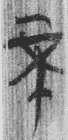不
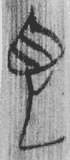見
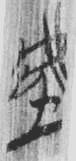○（吾）
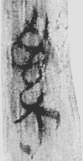○（奚）
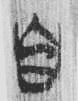自
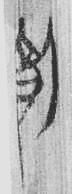飤
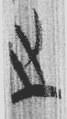之
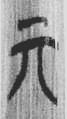亓（其）
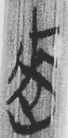○（來）
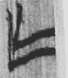亡（無）
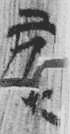厇（宅）
